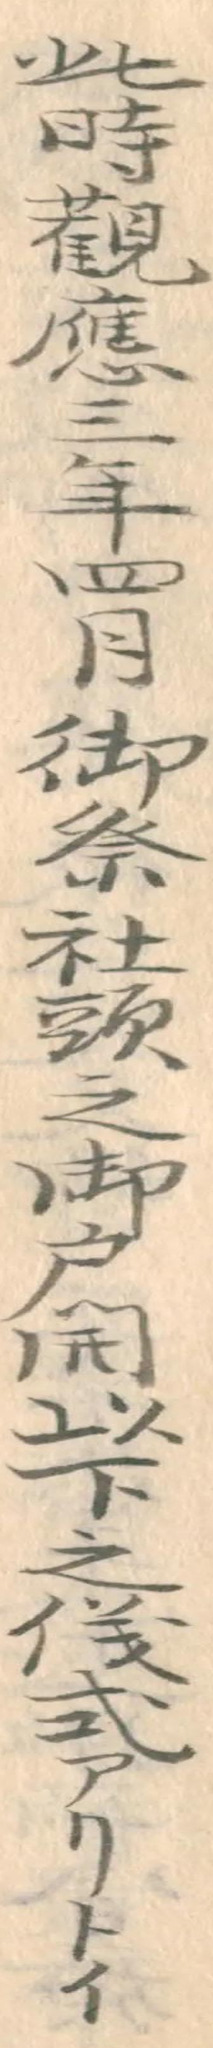此時観応三年四月御祭社頭之御戸開以下之儀式アリトイ
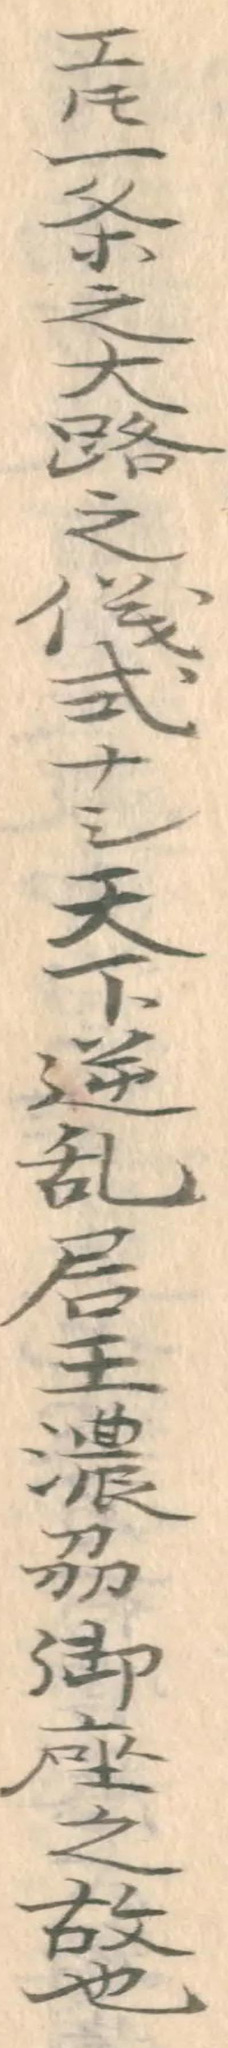エトモ一条之大路之儀式ナシ天下逆乱居王濃州御座之故也
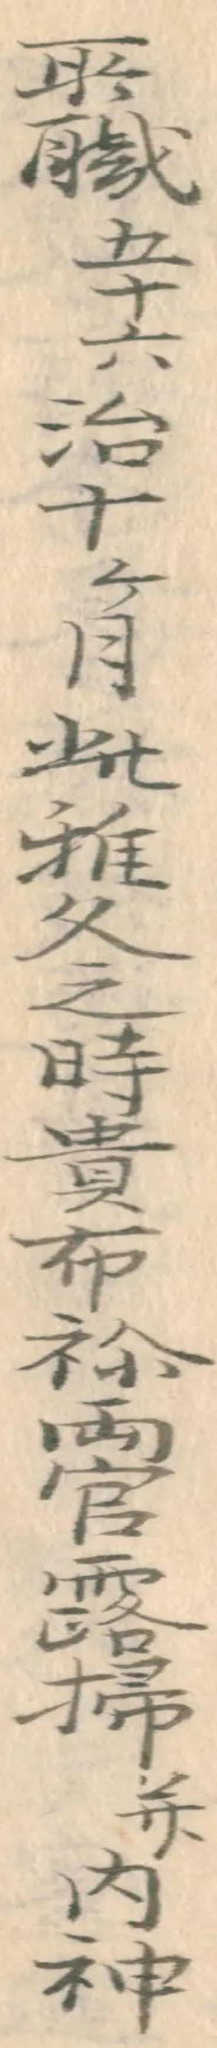所職五十六治十ケ月此雅久之時貴布祢両官露掃并内神
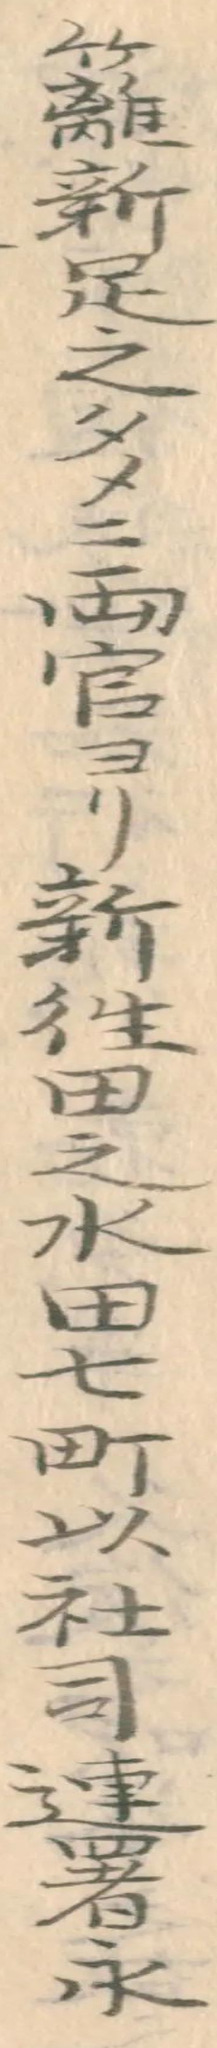籬新足之タメニ両官ヨリ新往田之水田七町以社司連署永
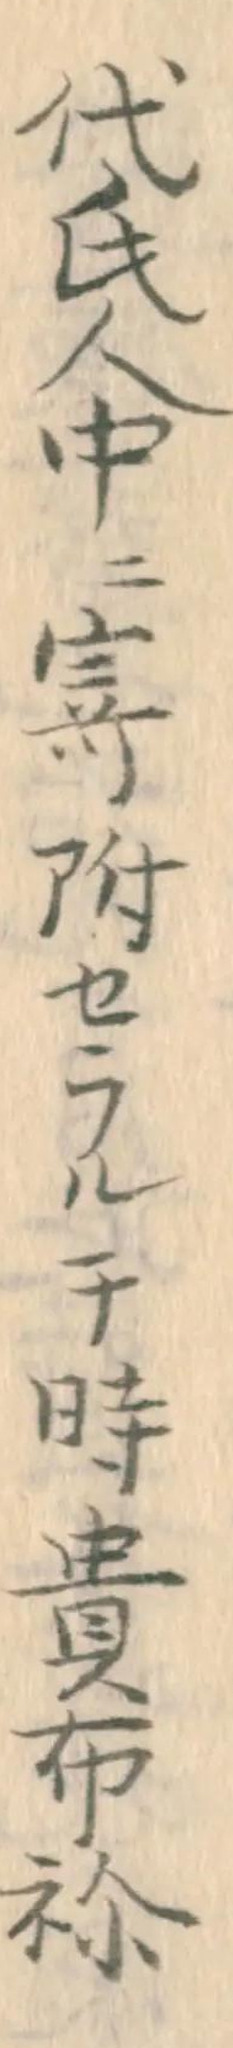代氏人中ニ寄附セラル于時貴布祢
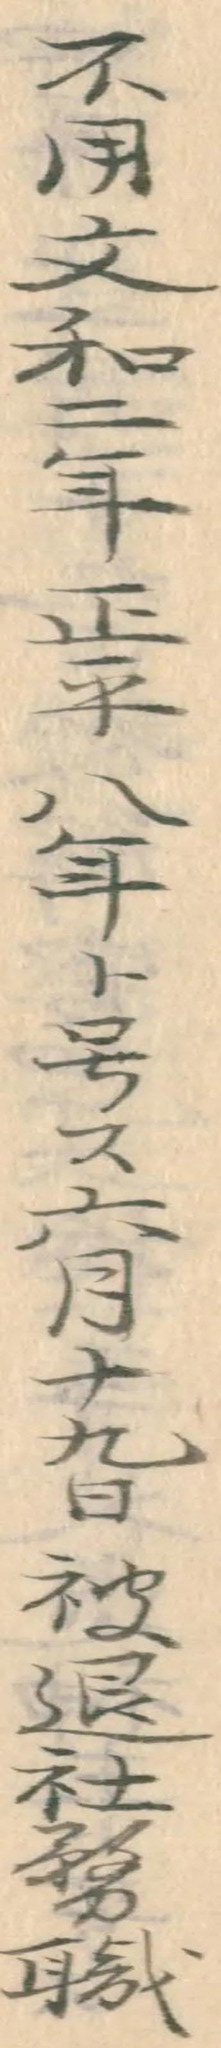不用文和二年正平八年ト号ス六月十九日被退社務職
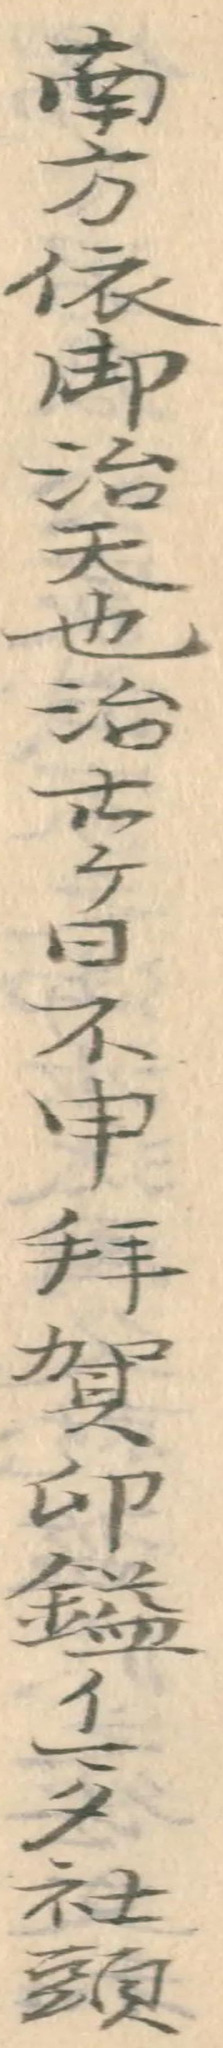南方依御治天也治廿ケ日不申拝賀印鎰イマタ社頭
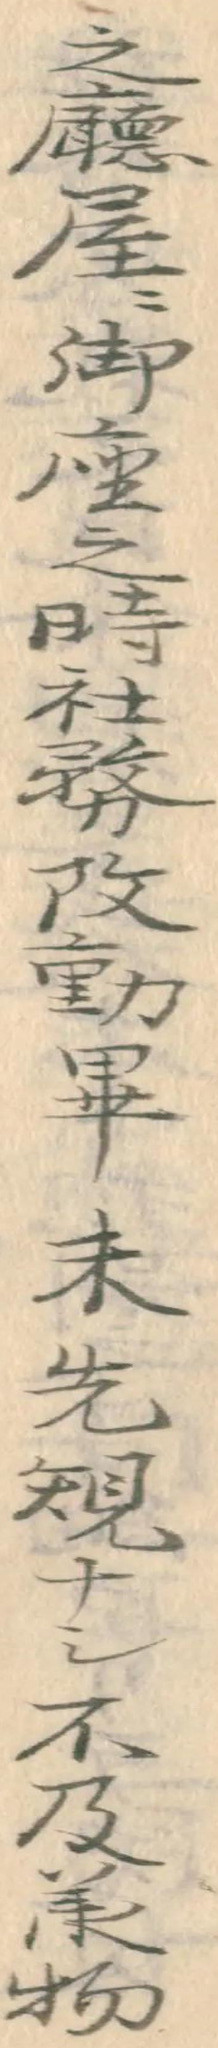之庁屋ニ御座之時社務改動畢未先規ナシ不及承物
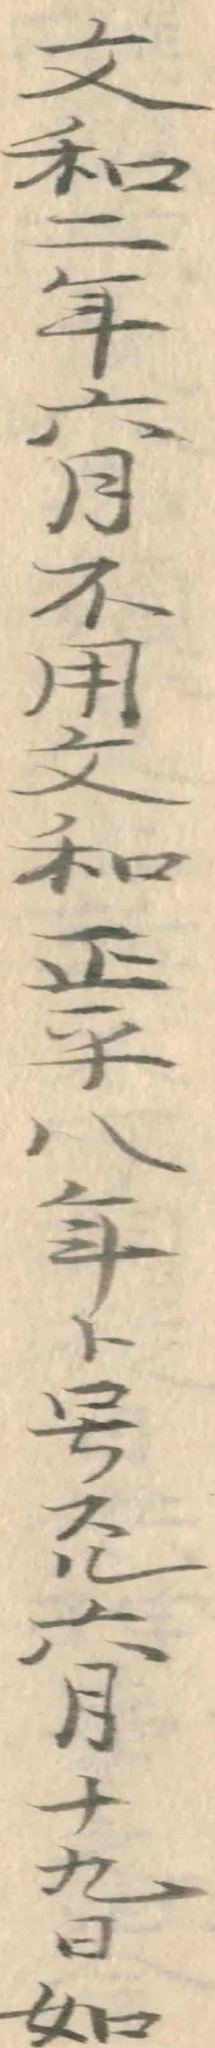文和二年六月不用文和正平八年ト号スル六月十九日如
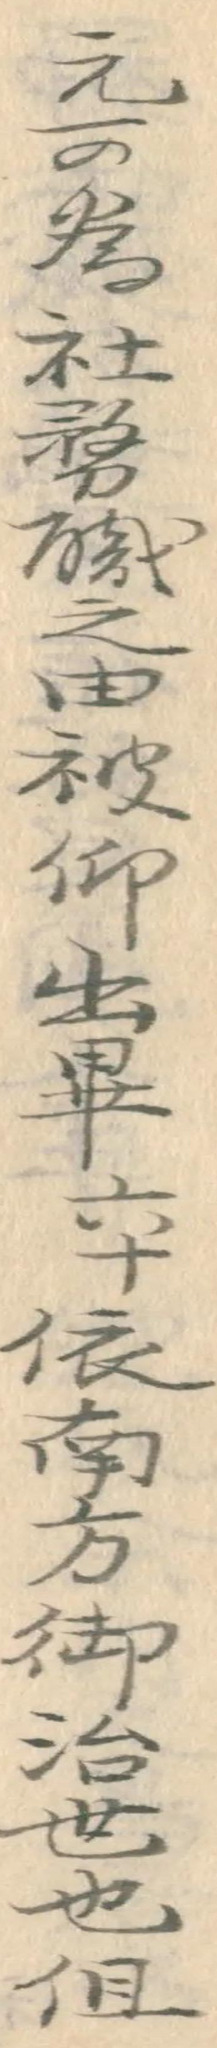元可為社務職之由被仰出畢六十依南方御治世也但
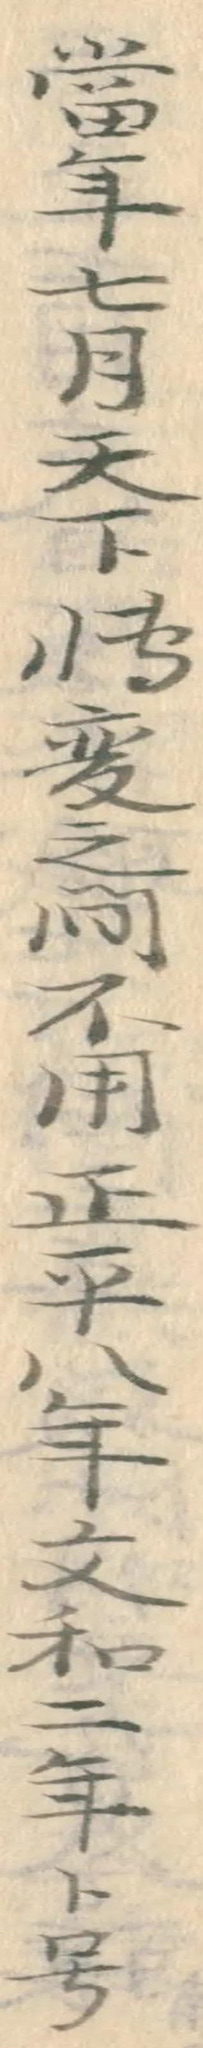当年七月天下転変之間不用正平八年文和二年ト号
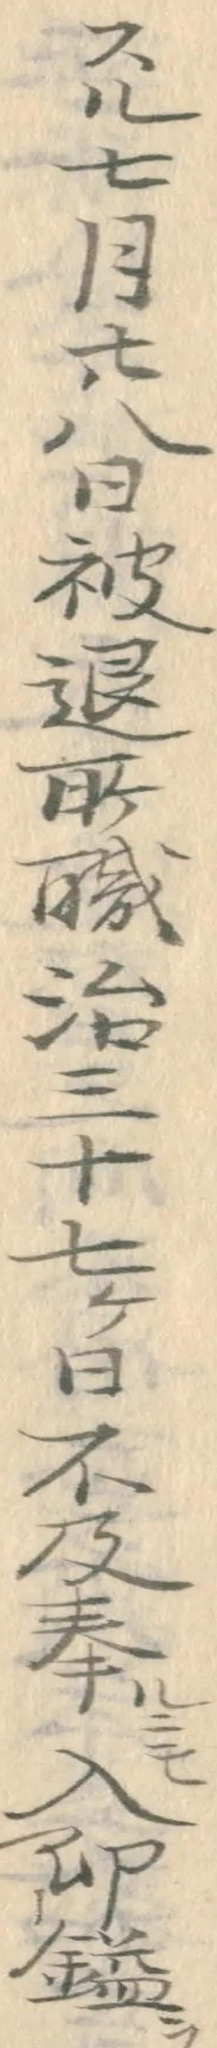スル七月廿八日被退所職治三十七ケ日不及奉ルニモ入印-鎰ヲ
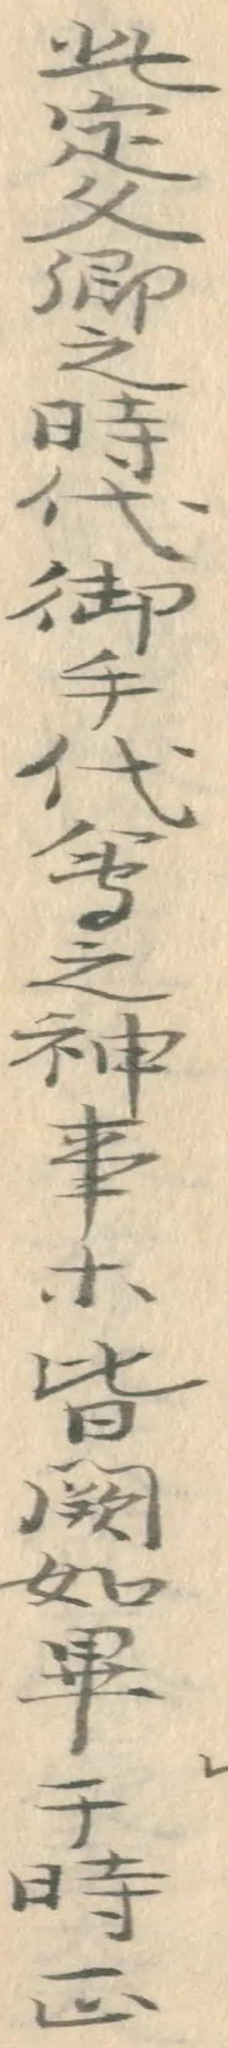此定久卿之時代御手代会之神事等皆闕如畢于時正
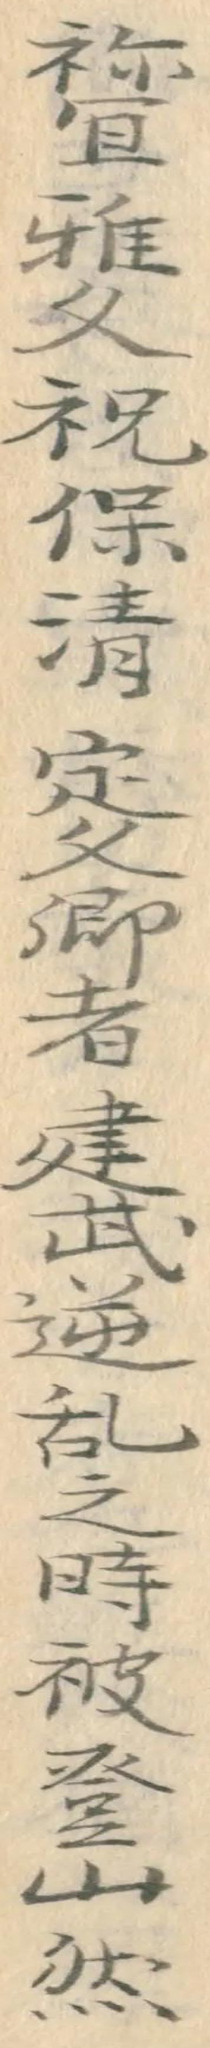祢宜雅久祝保清定久卿者建武逆乱之時被登山然

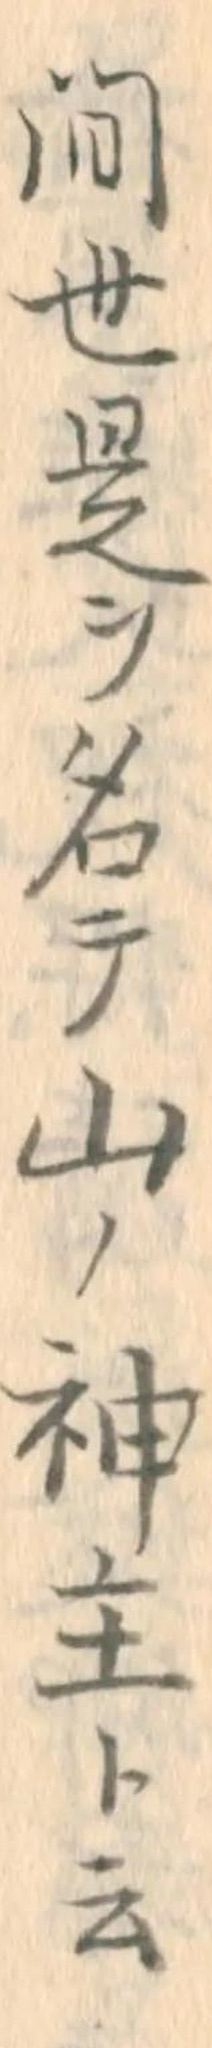間世是ヲ名テ山ノ神主ト云
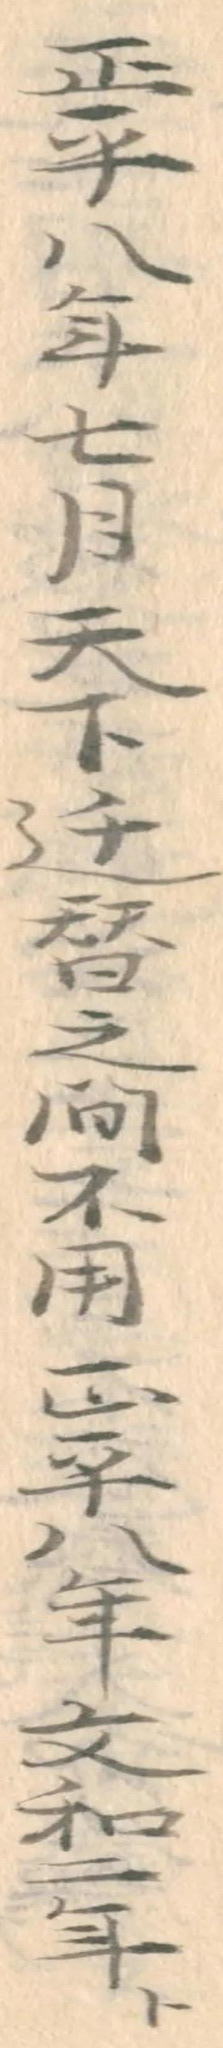正平八年七月天下遷替之間不用正平八年文和二年ト
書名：賀茂社記録. 第24冊
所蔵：国立国会図書館 National Diet Library, JAPAN
